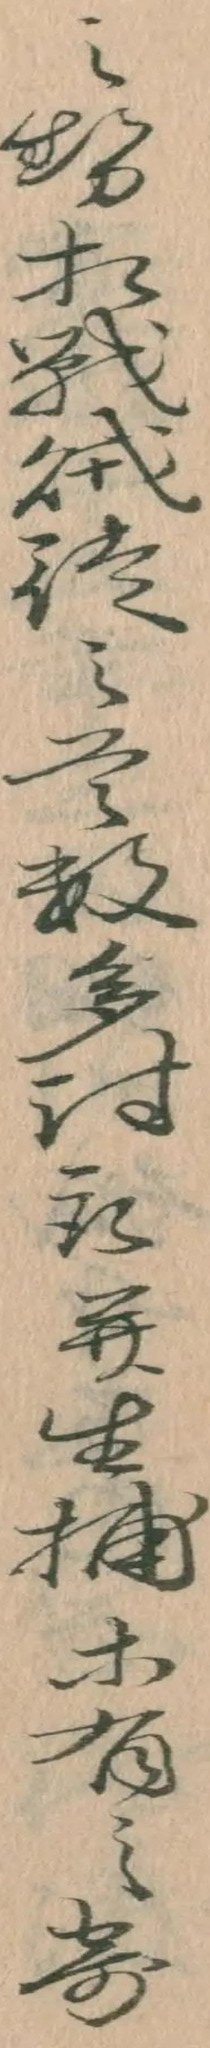之勢相戦賊徒之首数多討取幷生捕等有之寄
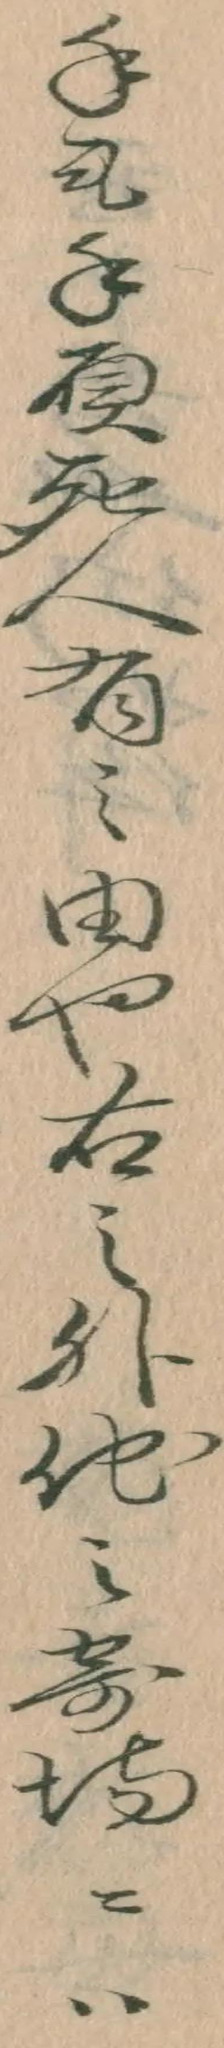手も手負死人有之由也右之外他之寄場には
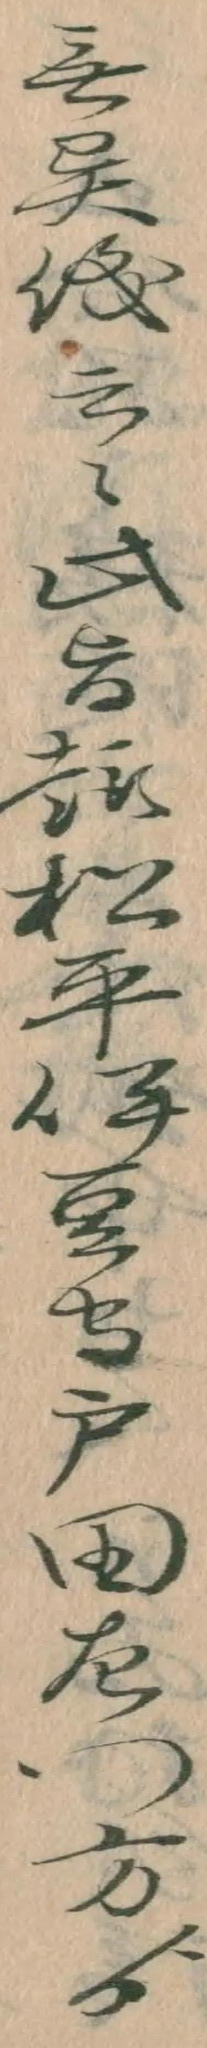無異儀云に此旨趣松平伊豆守戸田左門方ゟ
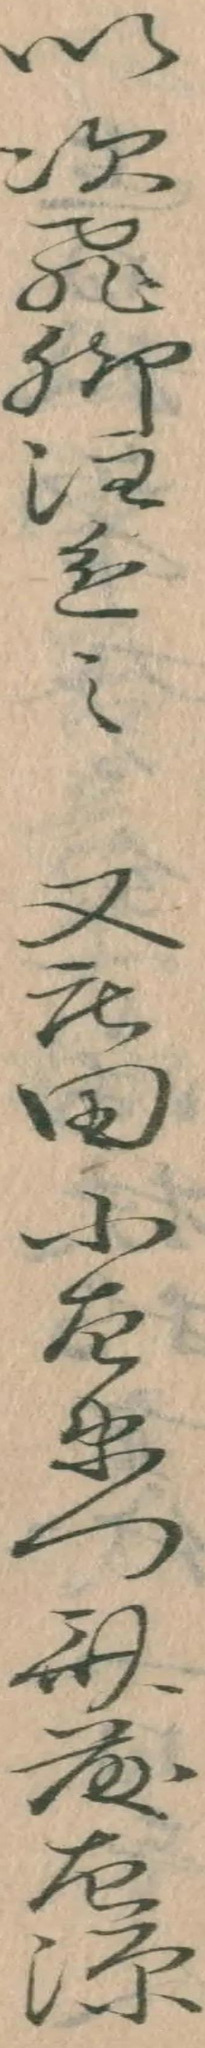以次飛脚注進之又庄田小左衛門斎藤左源
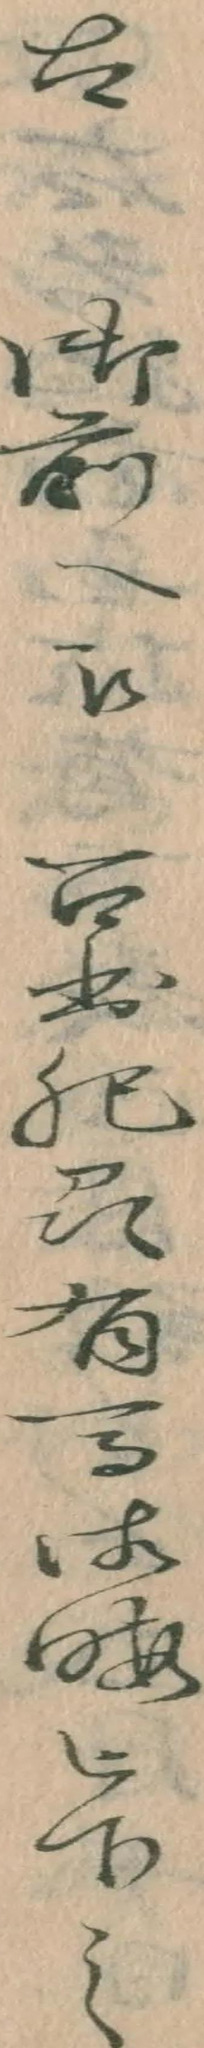太御前へ被召出肥州有馬御暇被下之
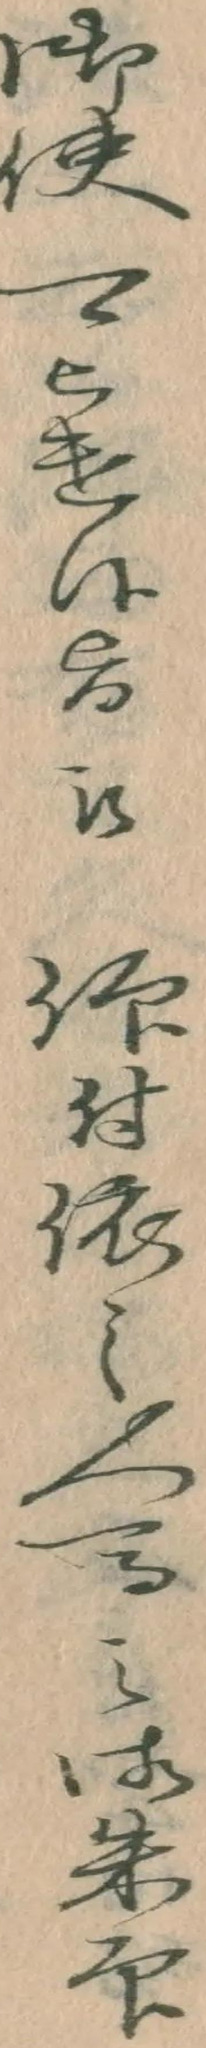御使可被遣候旨被仰付依之人馬之御朱印
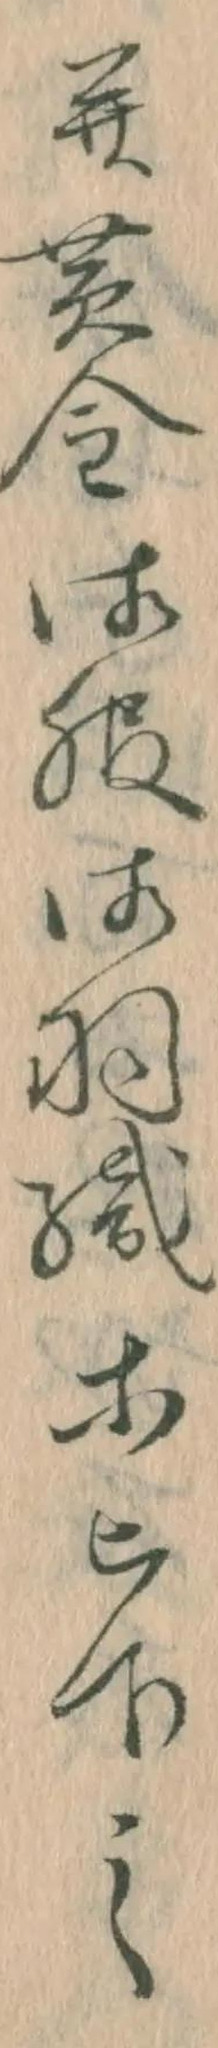幷黄金御服御羽織等被下之
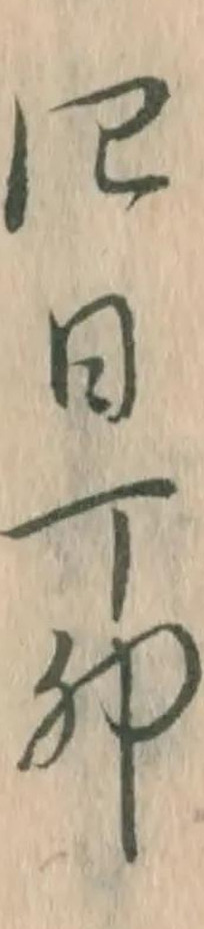四日丁夘
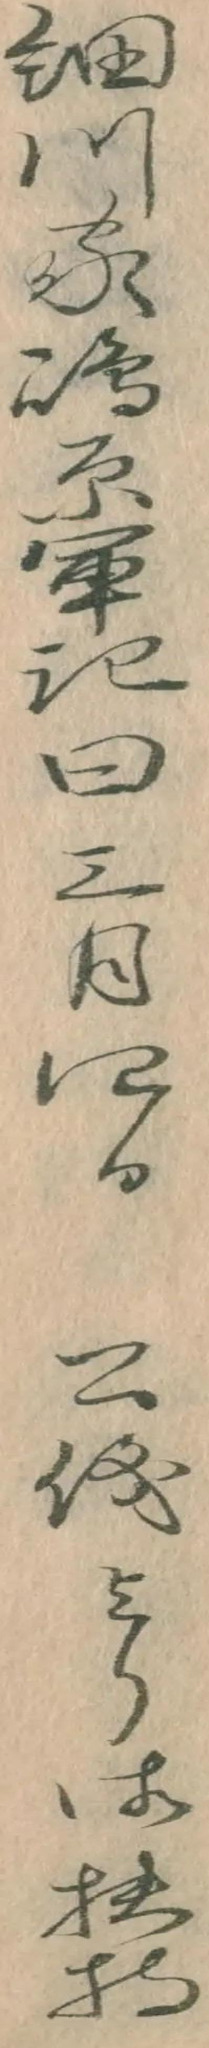細川家島原軍記曰三月四日公儀与り御扶持

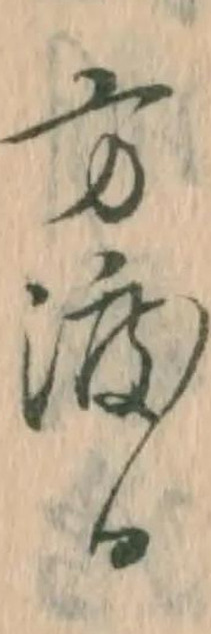方渡る
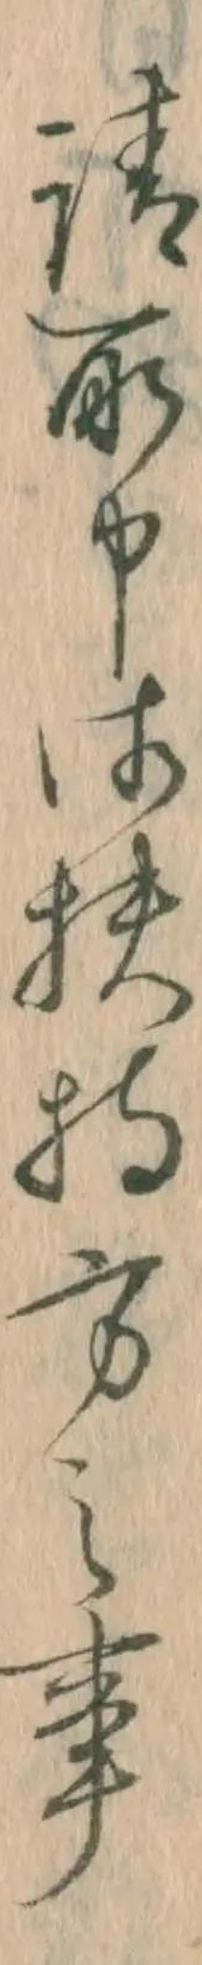請取申御扶持方之事
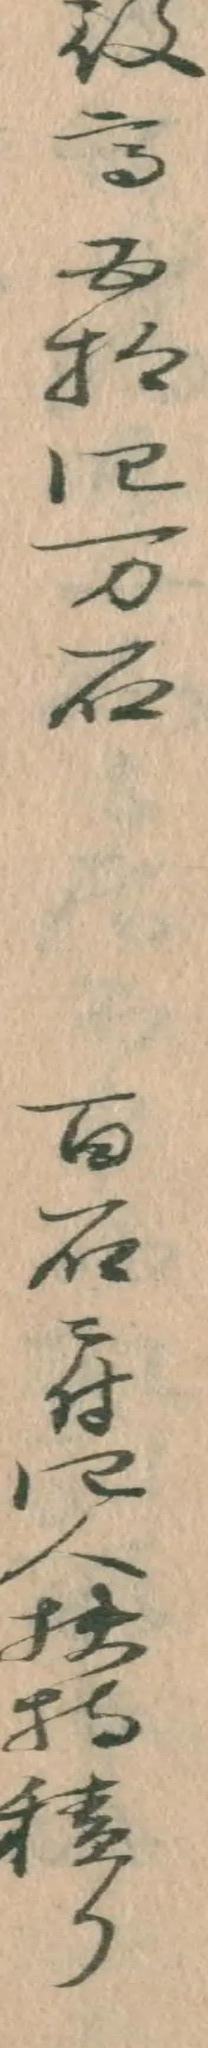役高五拾四万石百石に付四人扶持積り
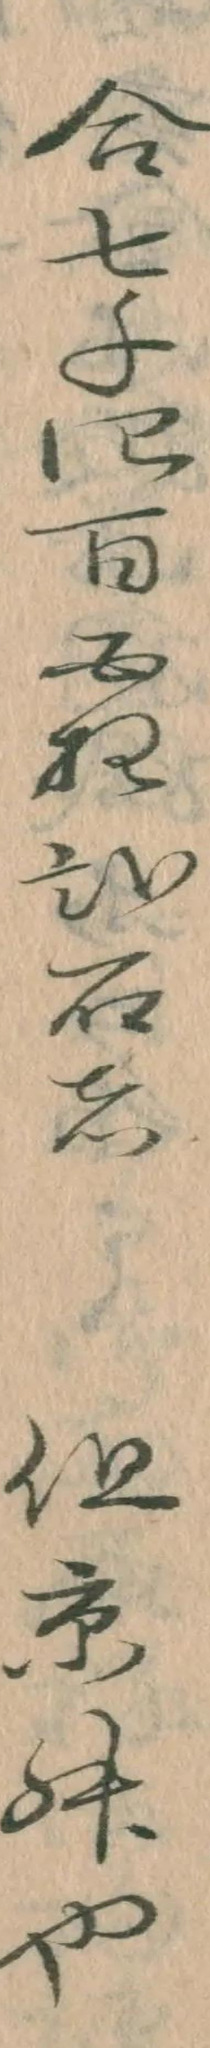合七千四百五拾弐石者但京升也
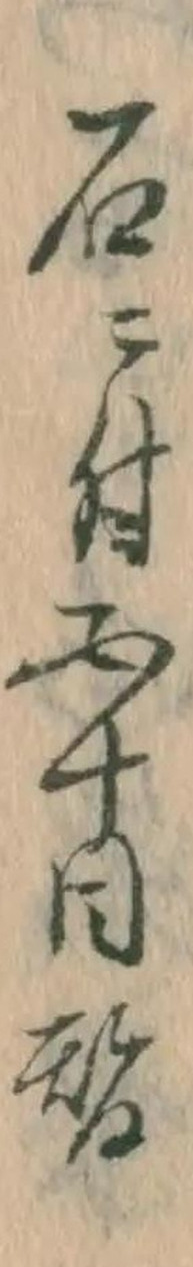石に付五十目替
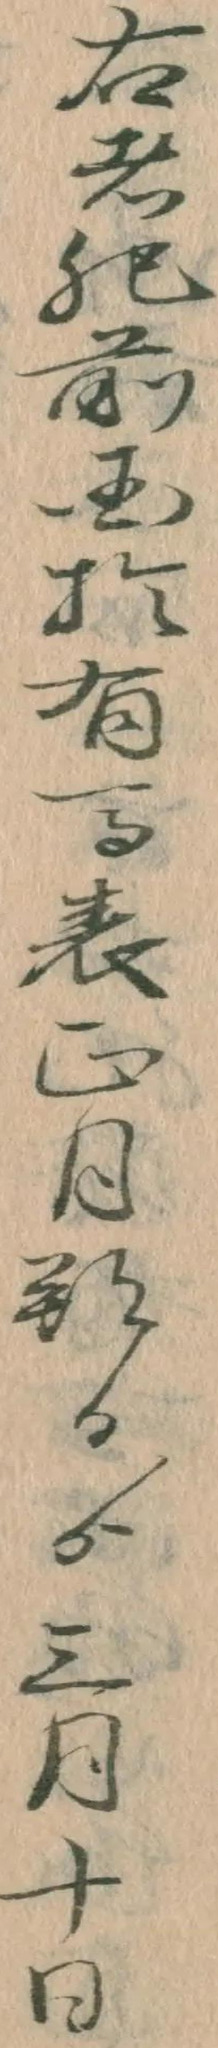右者肥前国於有馬表正月朔日ゟ三月十日
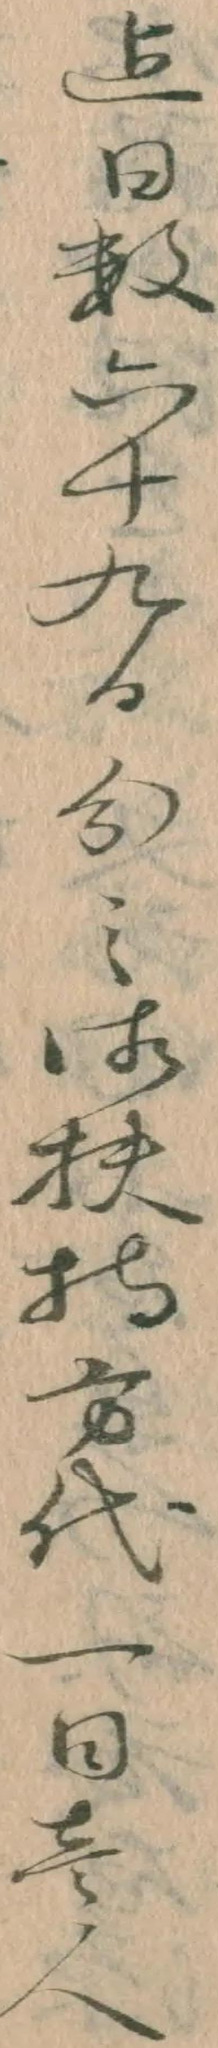迄日数六十九日分之御扶持方代一日壱人
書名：切支丹御退治記 49巻. [9]
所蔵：国立国会図書館 National Diet Library, JAPAN
